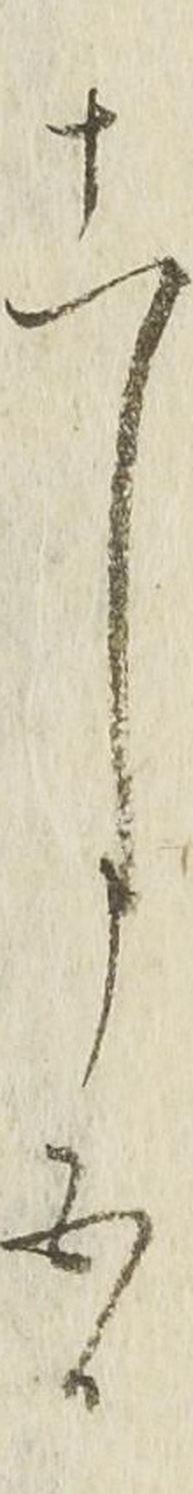十一月五日
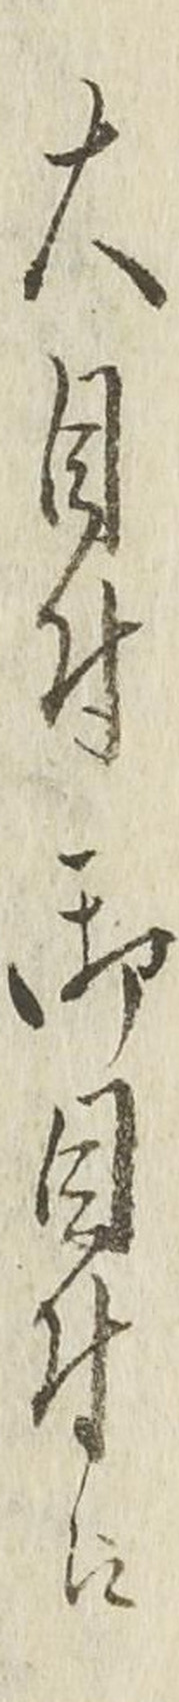大目付御目付え

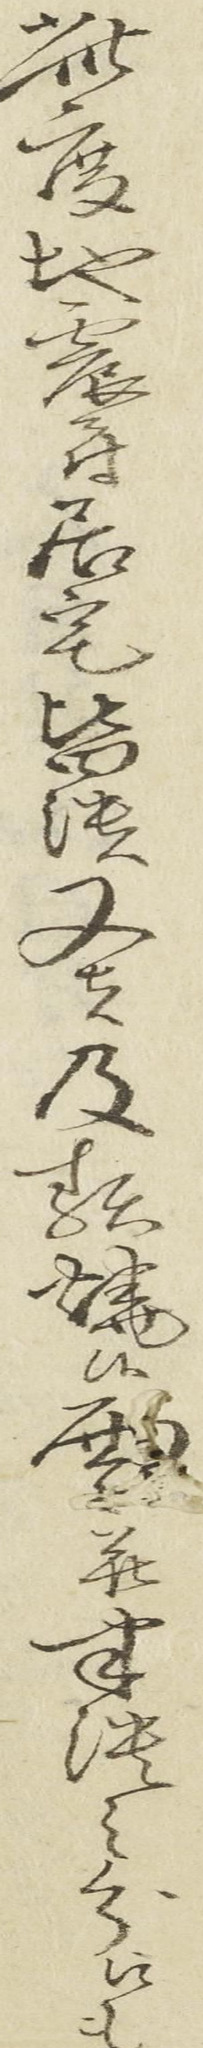此度地震ニ付居宅皆潰又は及類焼候幷半潰之分えも
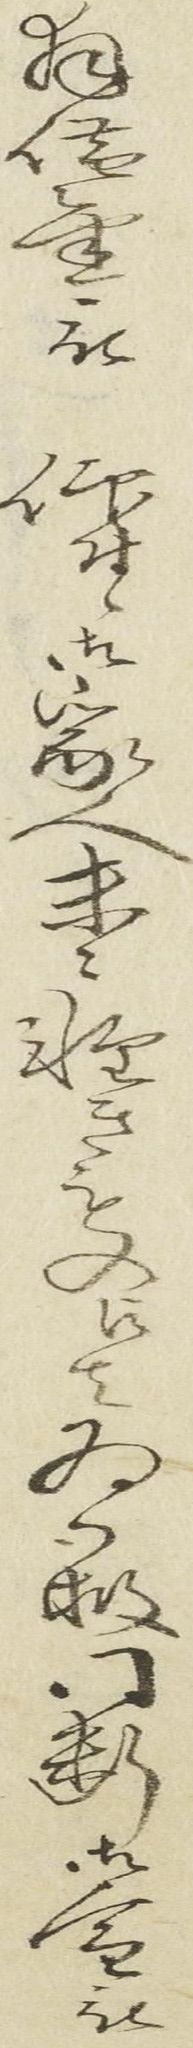拝借金被仰付候御家人末々軽きものえは為御救同断御金被
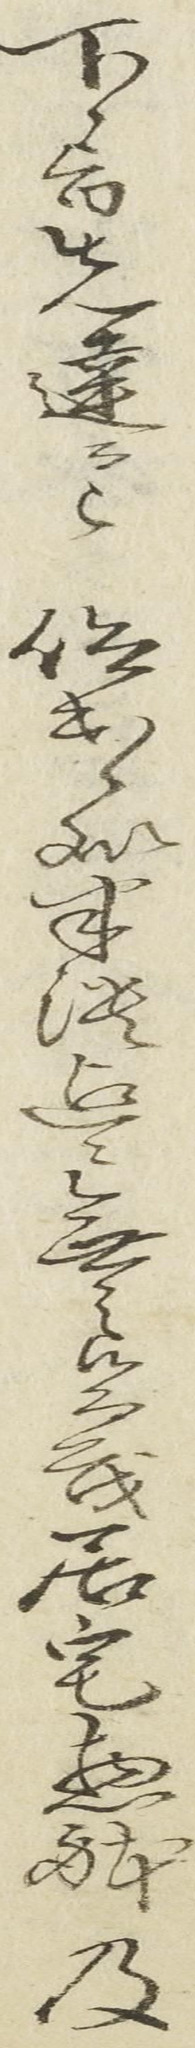下候旨先達而被仰出候処半潰迄ニ無之候而茂居宅惣躰及
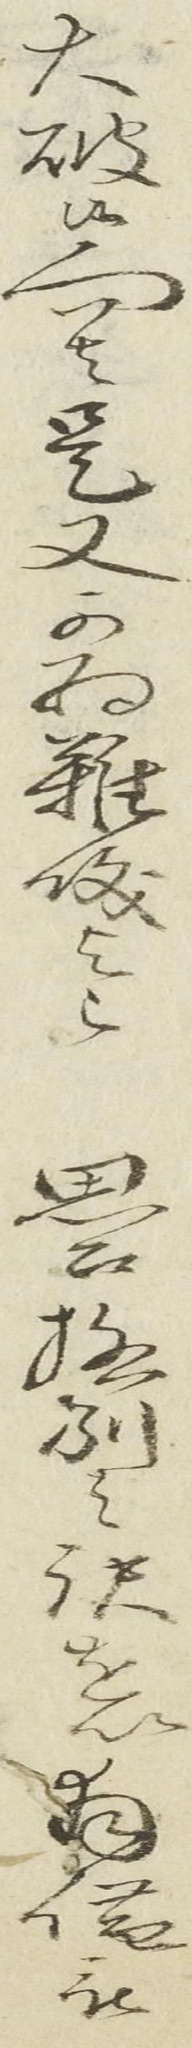大破候向は是又可為難儀と被思召各別之訳を以拝借被
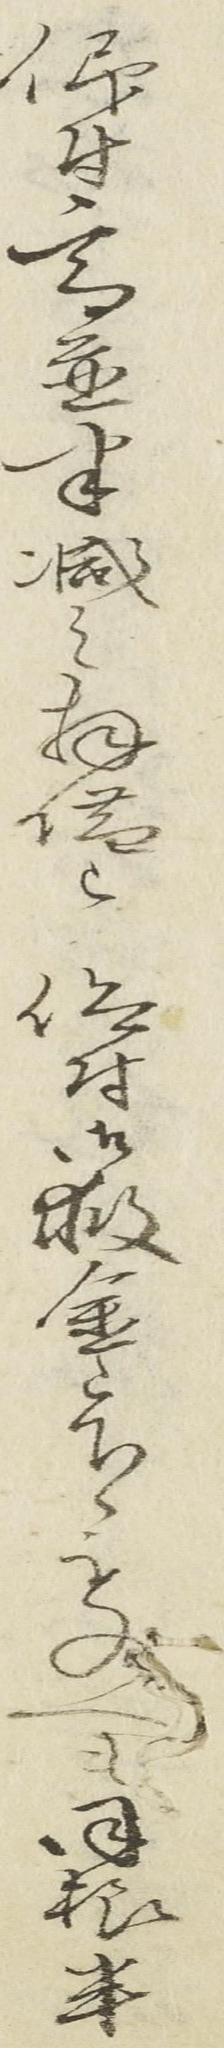仰付高並半減の拝借被御救金被下候物へも同様半
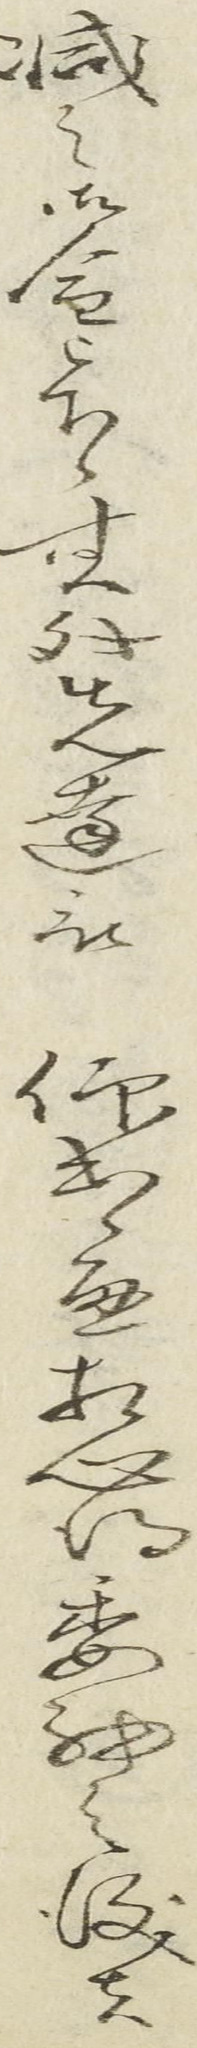減之御金被下候其外先達被仰出候通相心得委細之儀は
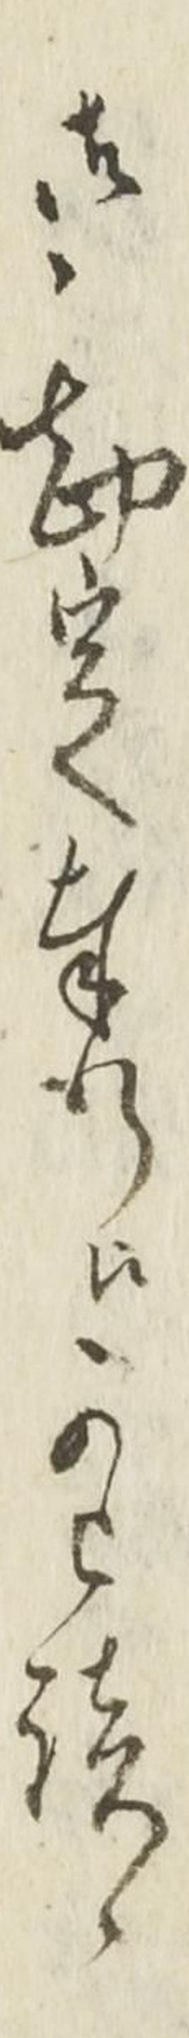御勘定奉行え可被談候
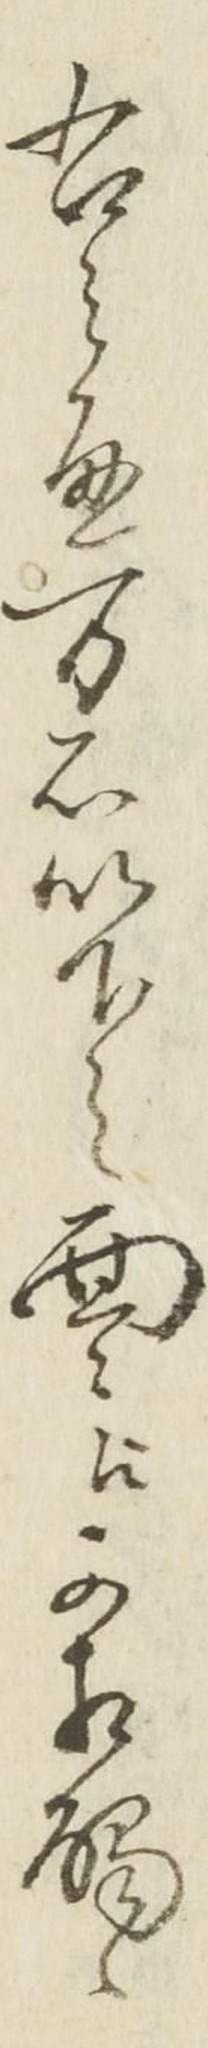右之通万石以下の面々へ可相触候
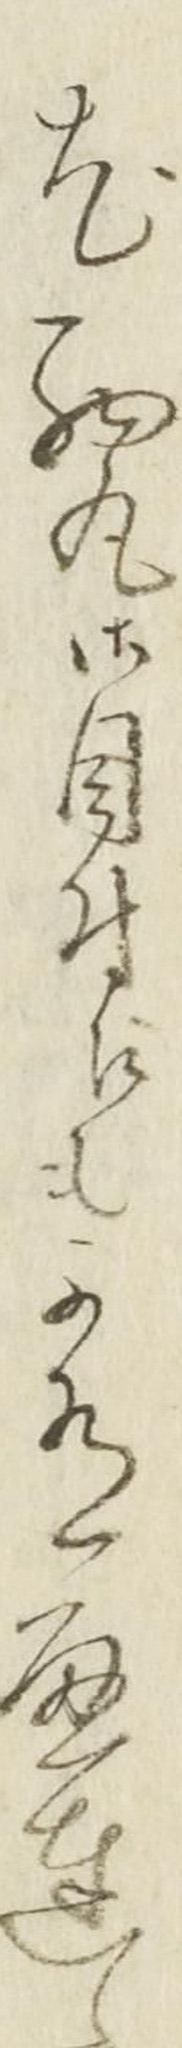尤西の丸御目付えも可有通達候
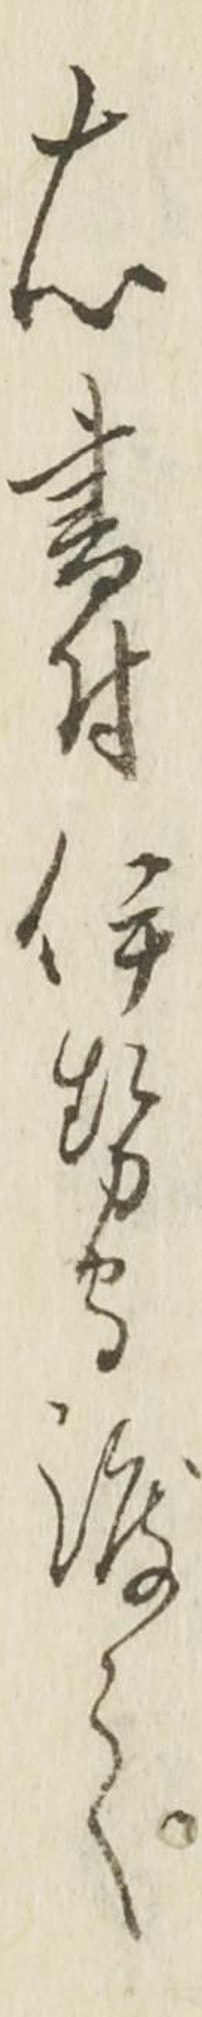右書付伊勢守渡之
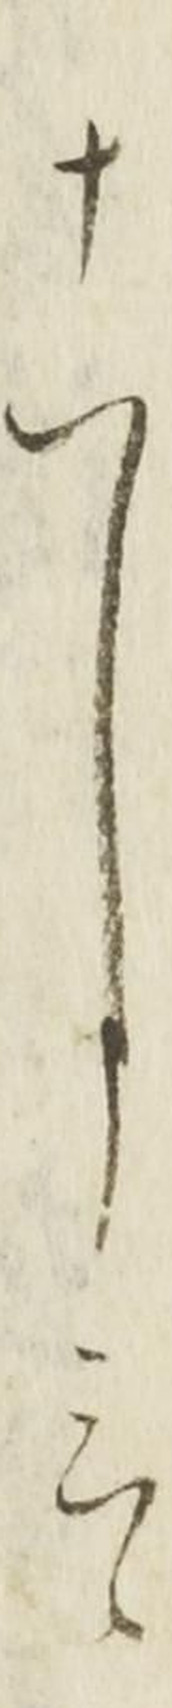十一月三日
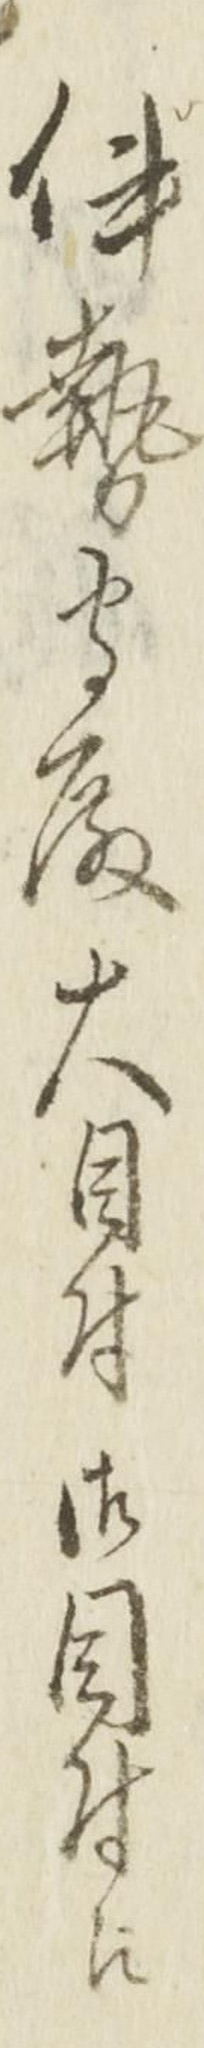伊勢守殿大目付御目付え
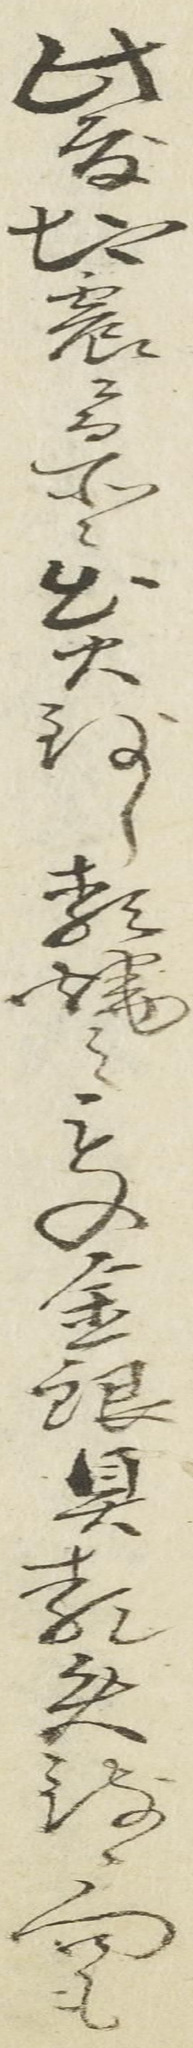此度地震ニ而所ゝ出火致し類焼のもの金銀具類失致候向も
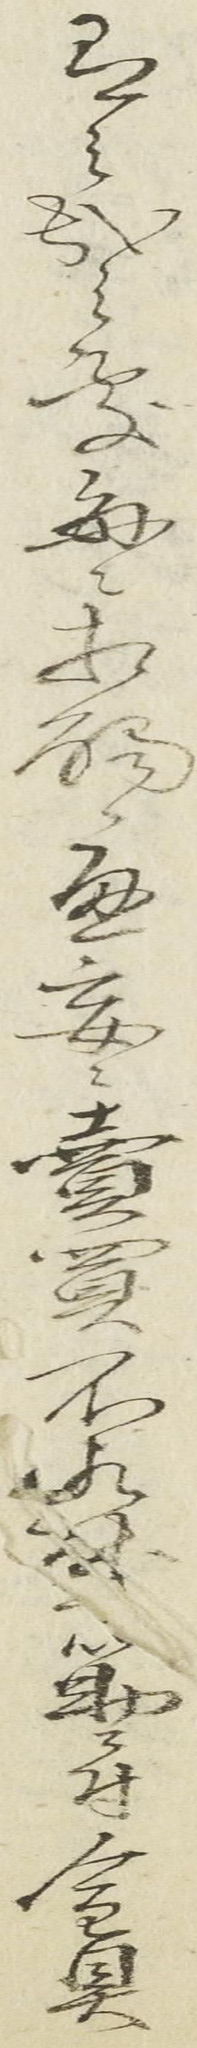有之哉之処毎々相触候通妄ニ売買不相筋ニ付金具
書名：安政二乙卯年十月二日大地震之事
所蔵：東京大学地震研究所図書室 Earthquake Research Institute Library, The University of Tokyo, JAPAN
